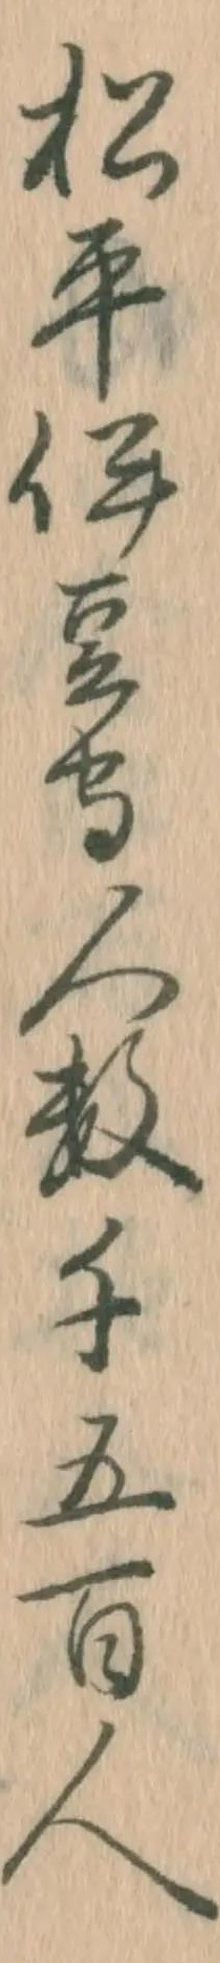松平伊豆守人数千五百人
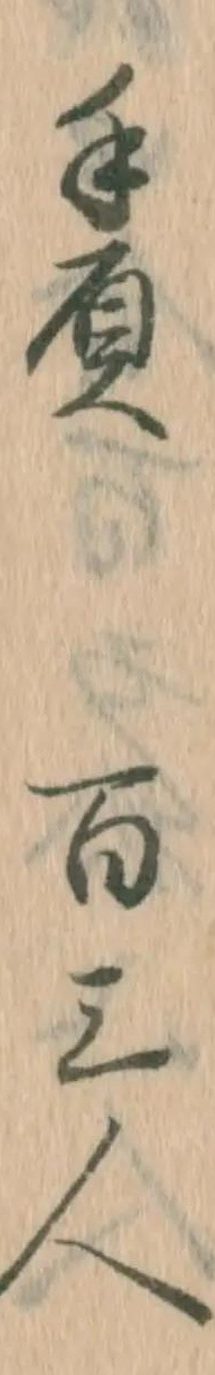手負百三人
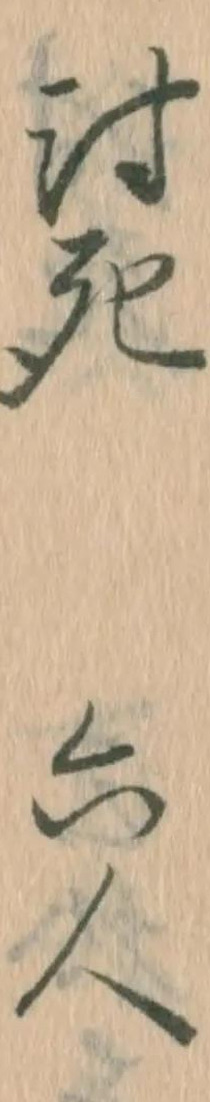討死六人
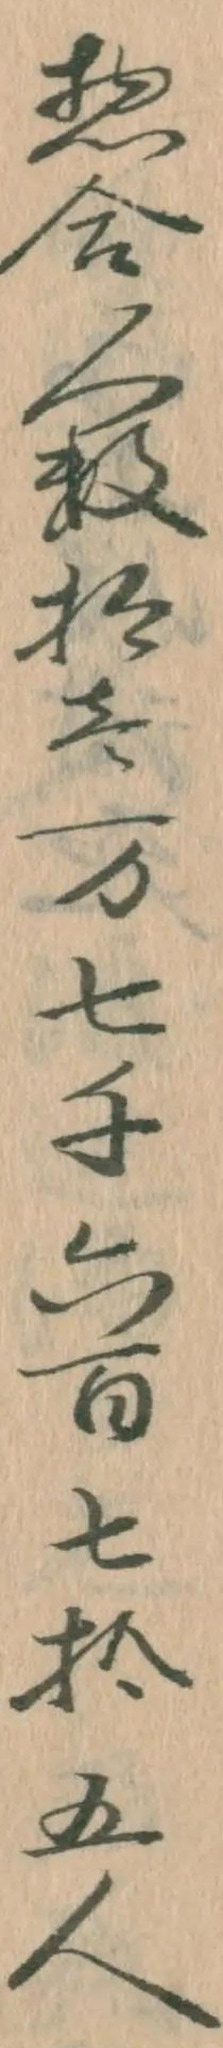惣合人数拾壱万七千六百七拾五人
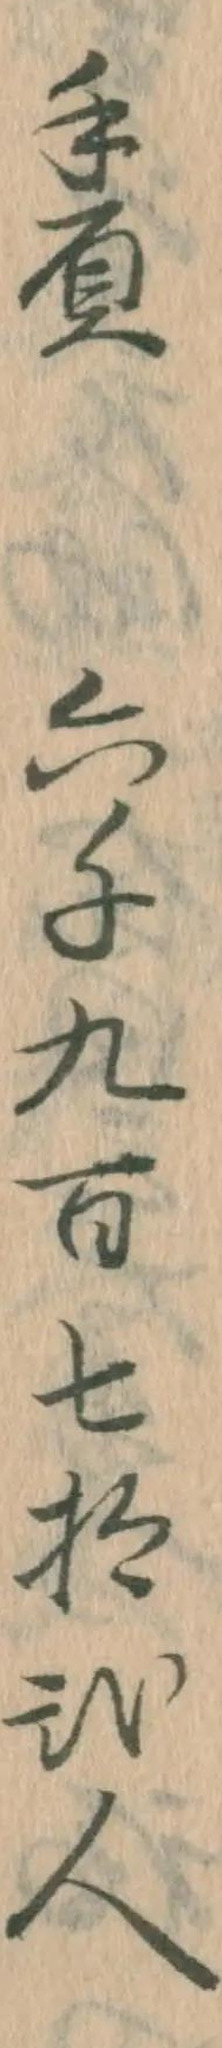手負六千九百七拾弐に人
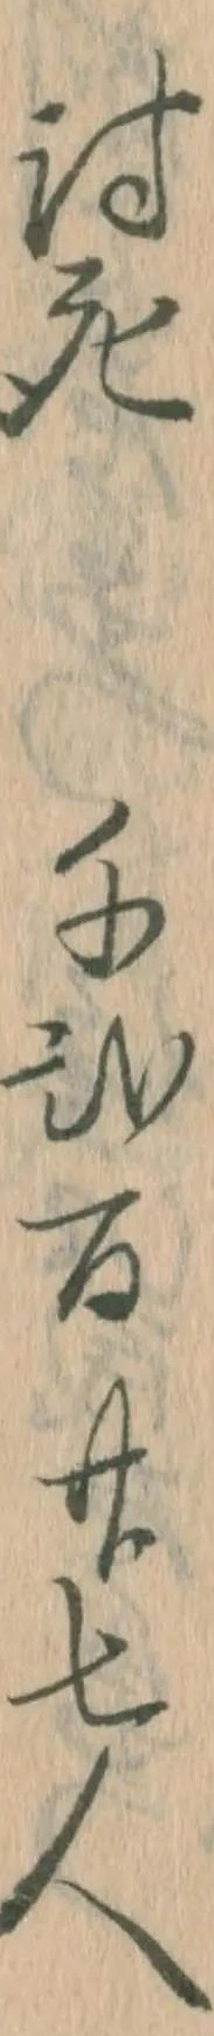討死千弐百廿七人
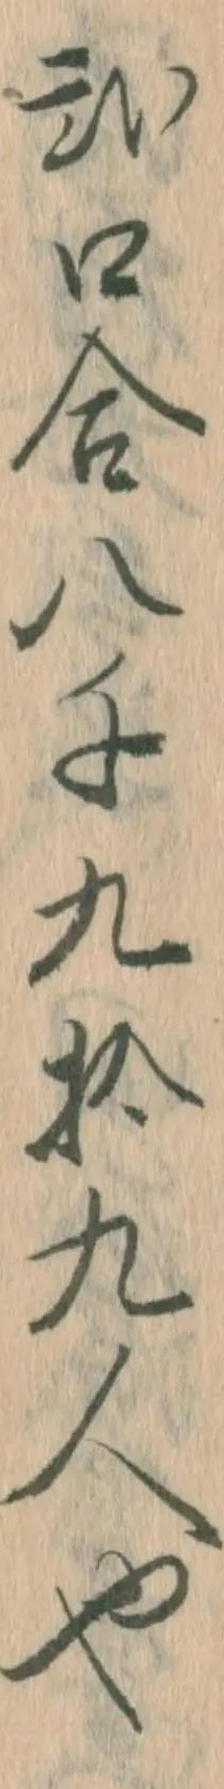弐口相合八千九拾九人也
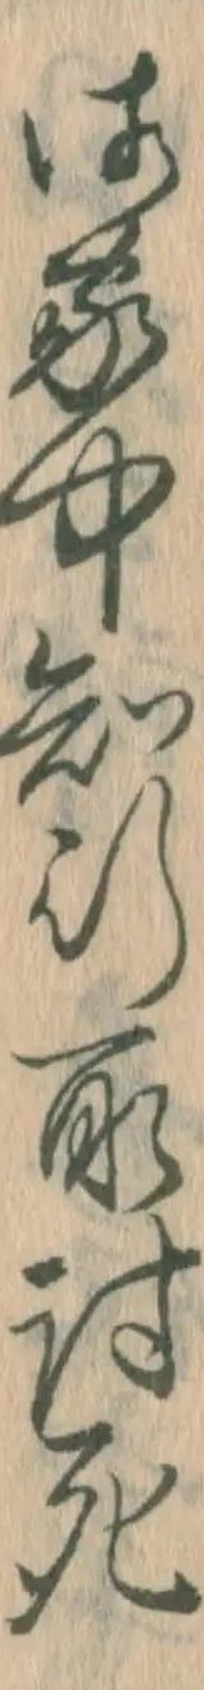御家中知行取討死
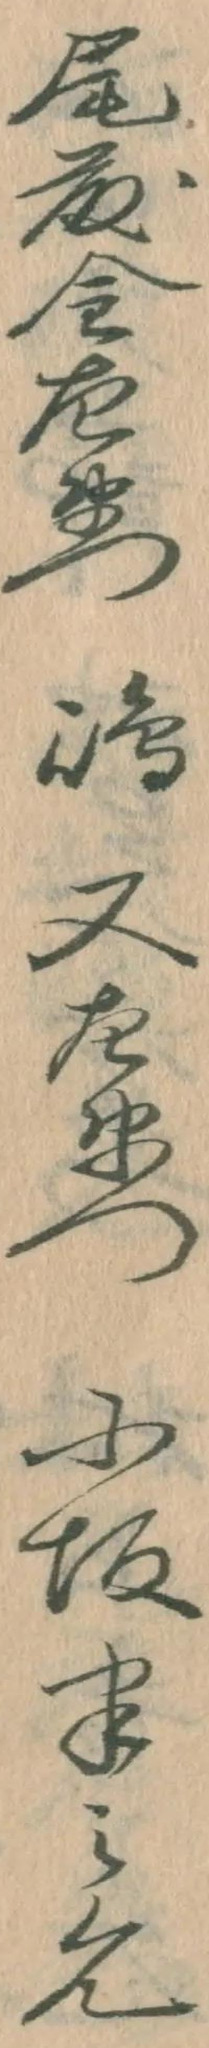尾崎金左衛門島又左衛門小坂半之允
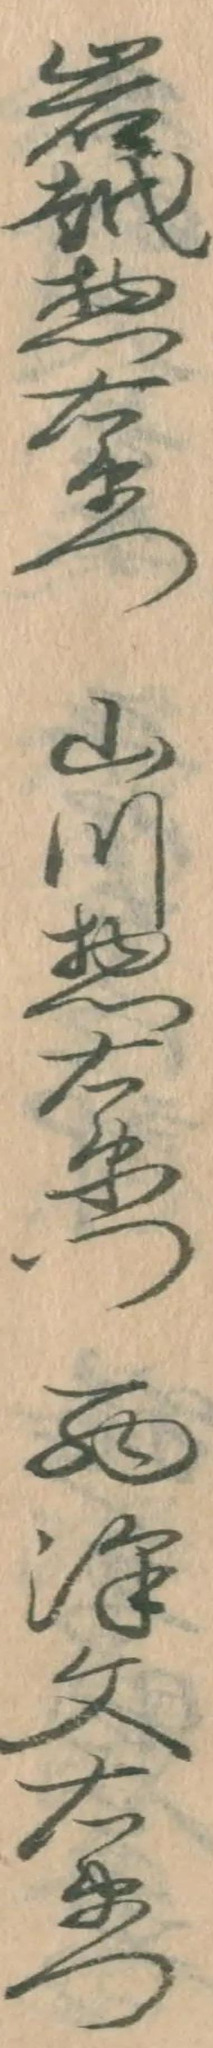岩越惣右衛門山川惣右衛門西沢又右衛門
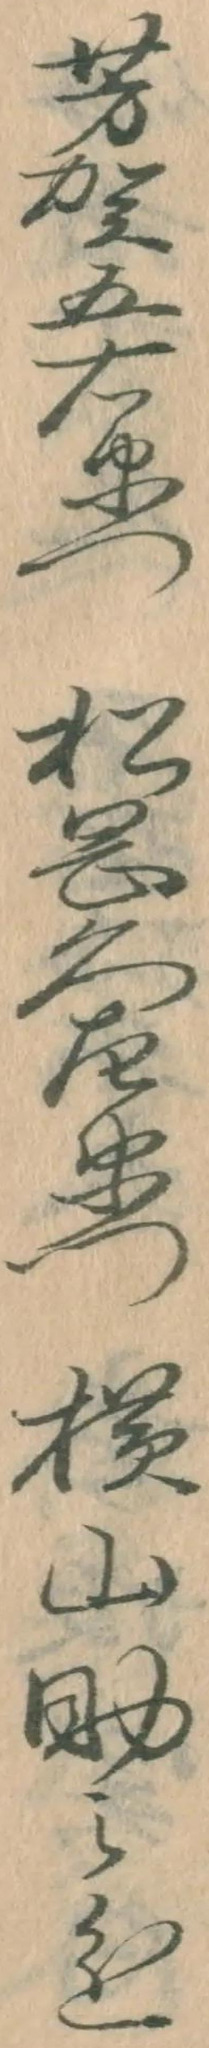芳賀五右衛門松岡九左衛門横山助之進

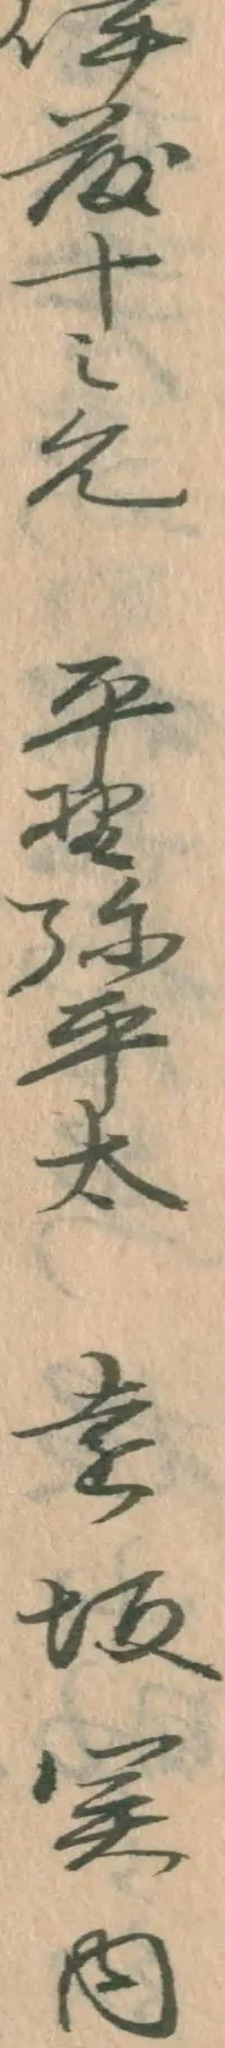伊藤十之允平賀弥平太遠坂関内
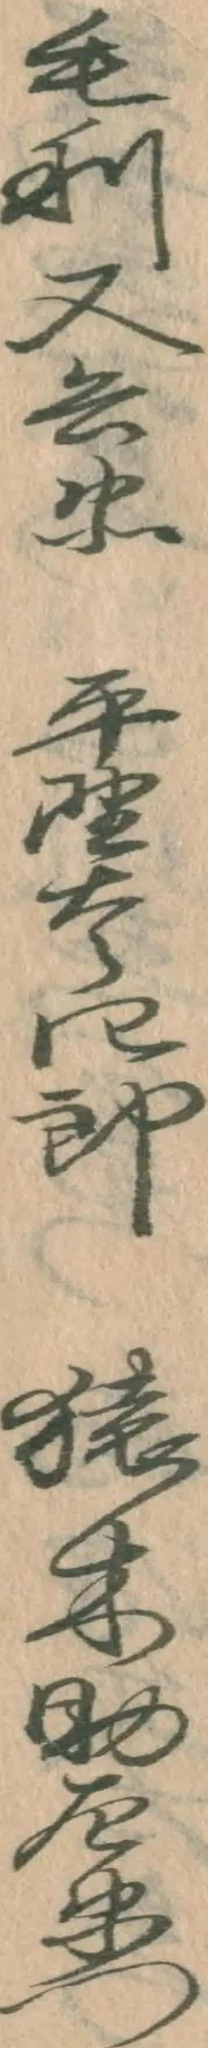毛利又兵衛平賀太郎四郎猿木助左衛門
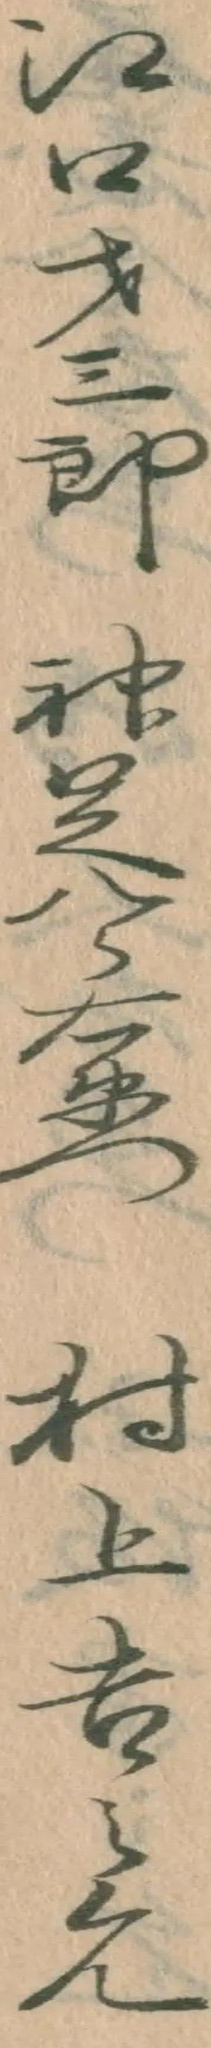江口才三郎神足八郎右衛門村上吉之允
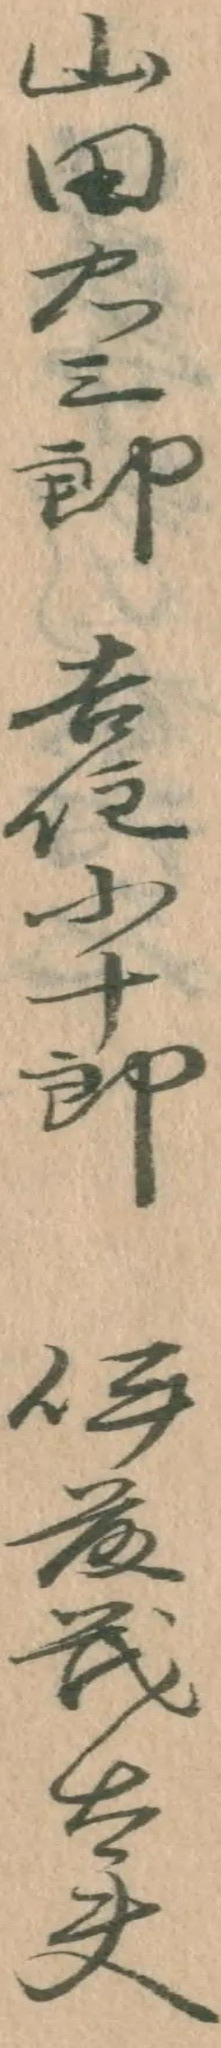山田忠三郎吉住小十郎伊藤茂太夫
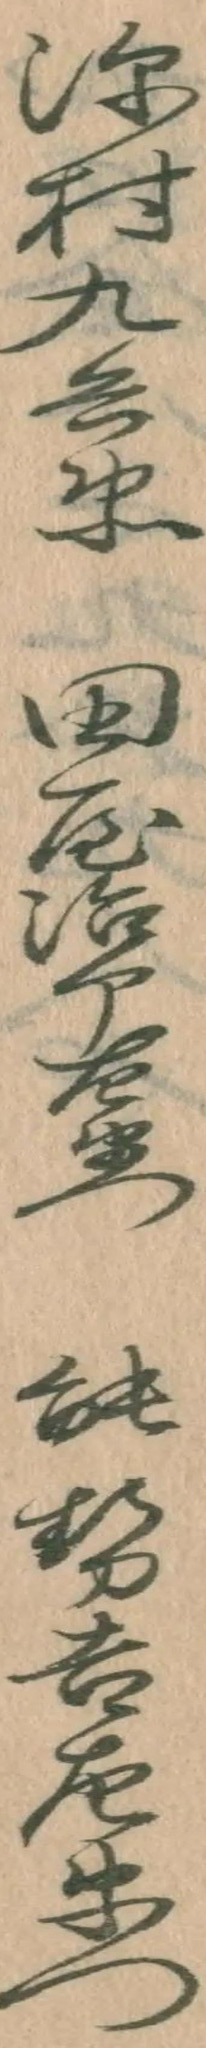沢村九兵衛田屋治部右衛門能勢吉左衛門
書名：切支丹御退治記 49巻. [9]
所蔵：国立国会図書館 National Diet Library, JAPAN
